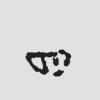四
